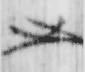之
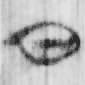日
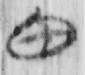甶（思）
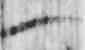一
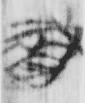戠
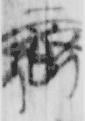獄
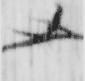之
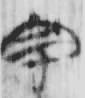○（主）
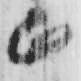㠯（以）
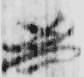至（致）
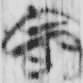命
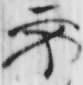不
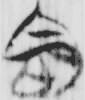命
